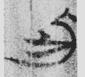此
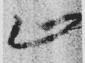㠯
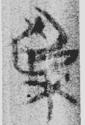桀
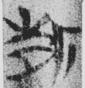折
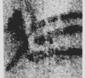於
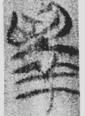鬲（歷）
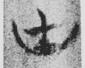山
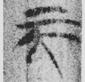而
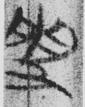受（紂）
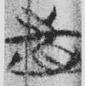{止首}
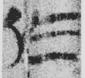於
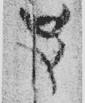只
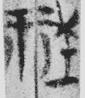{社木}（社）
